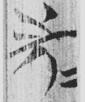先人
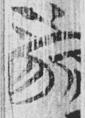之所
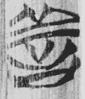善
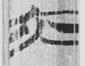亦
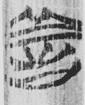善
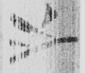之
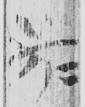先人
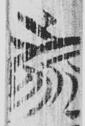之所
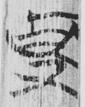○（變）
